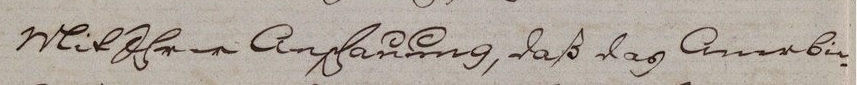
Mit Ihrer Anschauung, daß das Anerbie-
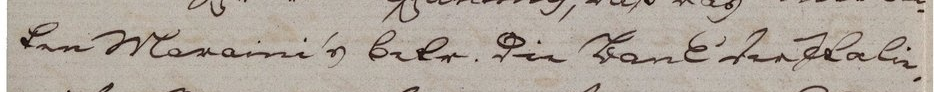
ten Maraini's betr. die Bank der Italie-
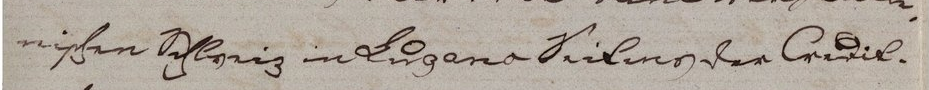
nischen Schweiz in Lugano Seitens der Credit-
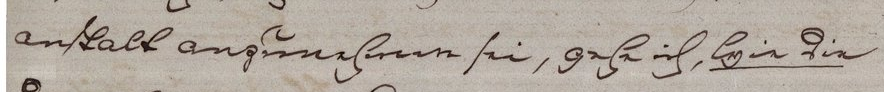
anstalt anzunehmen sei, gehe ich, wie die
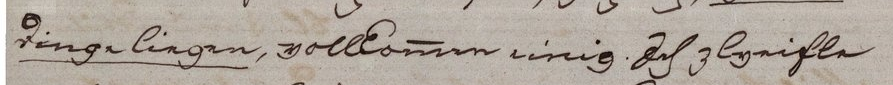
Dinge liegen, vollkommen einig. Ich zweifle
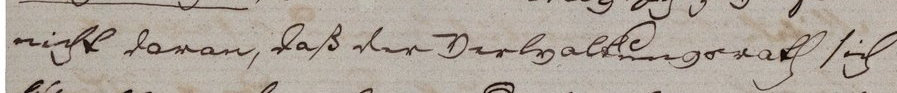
nicht daran, daß der Verwaltungsrath sich
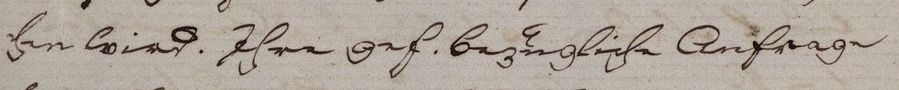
chen wird. Ihre gef. bezügliche Anfrage
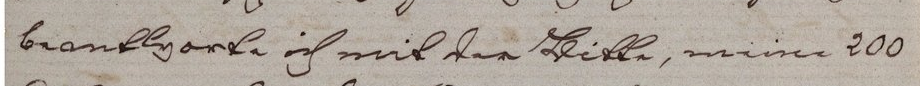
beantworte ich mit der Bitte, meine 200
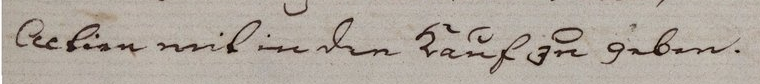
Actien mit in den Kauf zu geben.
